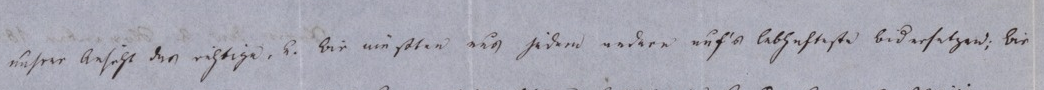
unsrer Ansicht das richtige, u. wir müßten uns jedem andern auf's lebhafteste widersetzen; wir
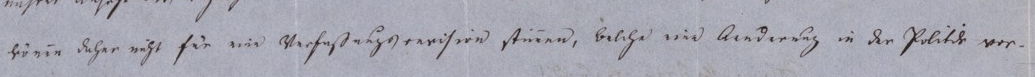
können daher nicht für eine Verfassungsrevision stimmen, welche eine Aenderung in der Politik vor-
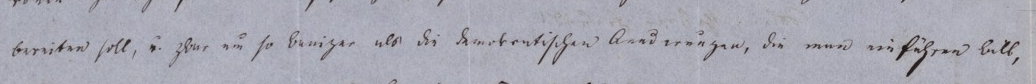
bereiten soll, u. zwar um so weniger als die demokratischen Aenderungen, die man einführen will,
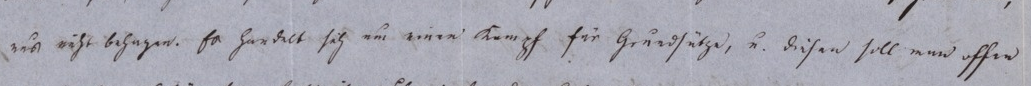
uns nicht behagen. Es handelt sich um einen Kampf für Grundsätze, u. diesen soll man offen
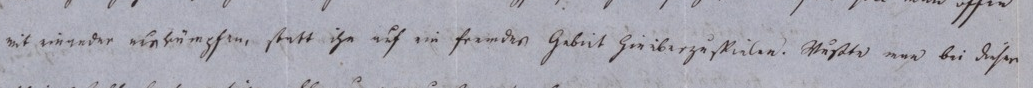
mit einander auskämpfen, statt ihn auf ein fremdes Gebiet hinüberzuspielen. Wußte man bei dieser
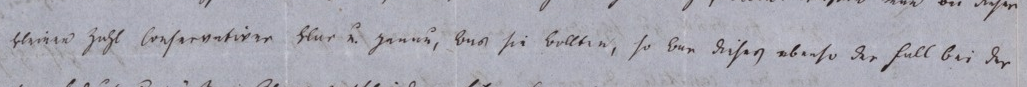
kleinen Zahl Conservativen klar u. genau, was sie wollten, so war dieses ebenso der Fall bei der
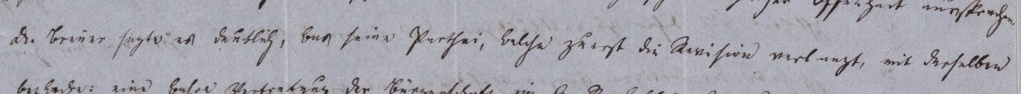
Dr. Brenner sagte es deutlich, was seine Parthei, welche zuerst die Revision verlangt, mit derselben
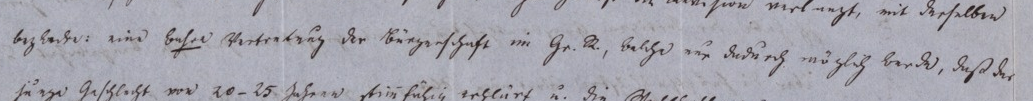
bezwecke: eine wahre Vertretung der Bürgerschaft im Gr. R., welche nur dadurch möglich werde, daß das
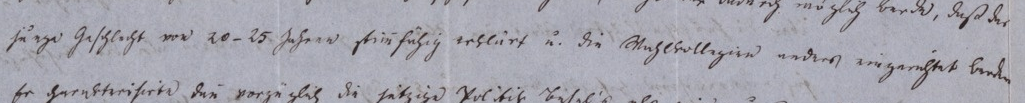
junge Geschlecht von 20-25 Jahren stimmfähig erklärt u. die Wahlkollegien anders eingerichet werden.
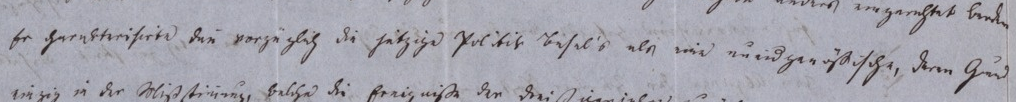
Er charakterisirte dann vorzüglich die jetzige Politik Basel's als eine uneidgenössische, deren Grund
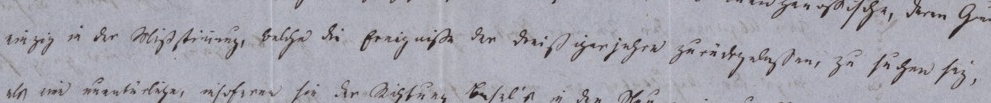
einzig in der Mißstimmung, welche die Ereignisse der Dreißigerjahre zurückgelassen, zu suchen sey,
